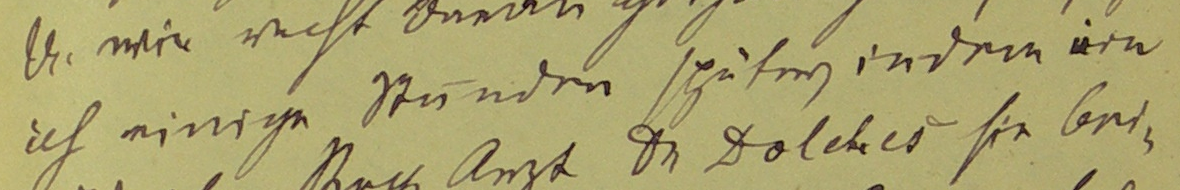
ich einige Stunden später indem ein
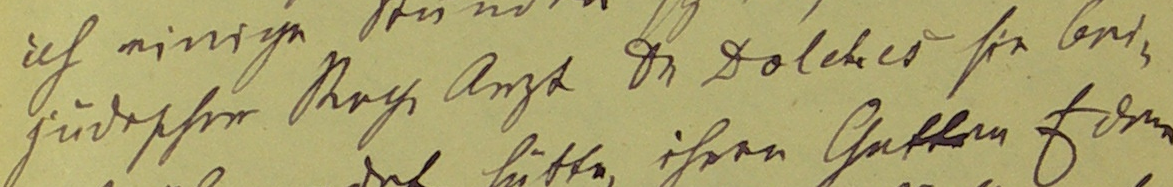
Jüdischer Arzt Dr. Dolches sie bei¬
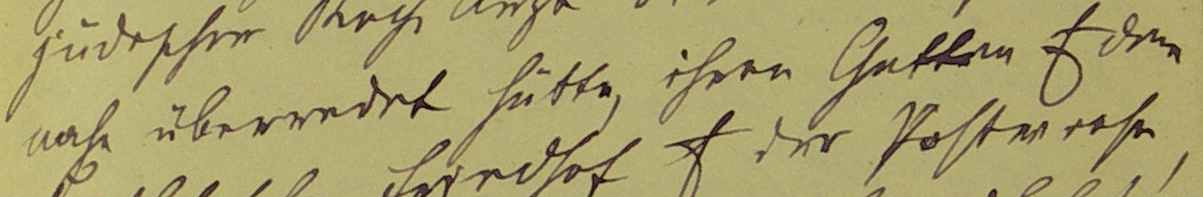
nahe überredete hatte , ihren Gatten auf dem
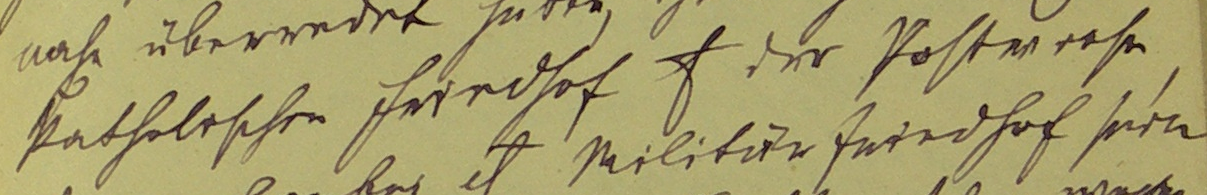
Katholischen Friedhof auf der Postwiese
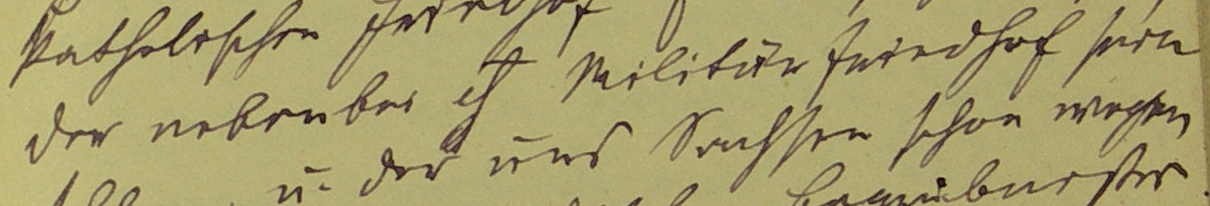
der nebenbei auch Militärfriedhof sein
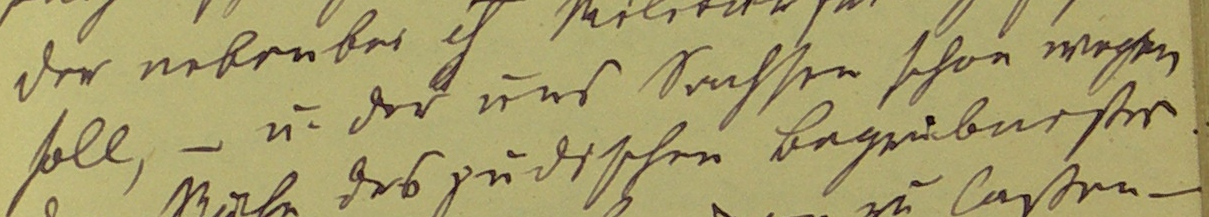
soll,--und der uns Sachsen schon wegen
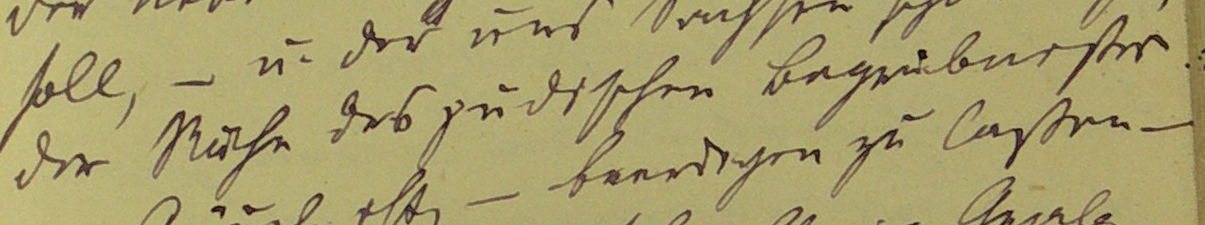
der Nähe des jüdischen Begräbnißes
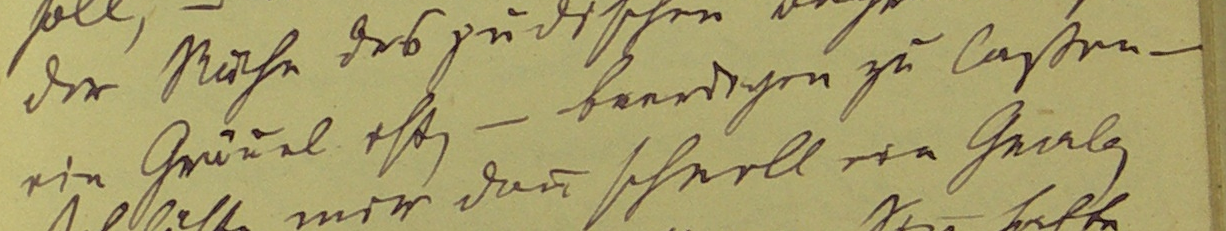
ein Gräuel ist.- beerdigen zu lassen.-
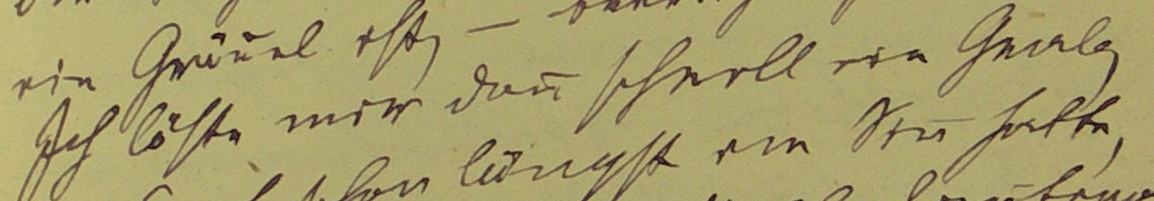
Ich löste mir dann schnell ein Grab
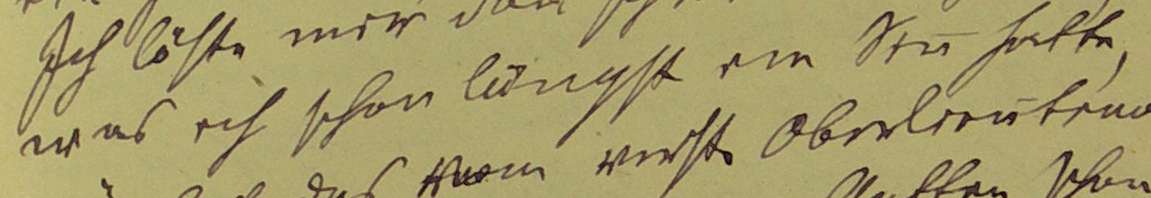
was ich schon längst im Sinn hatte
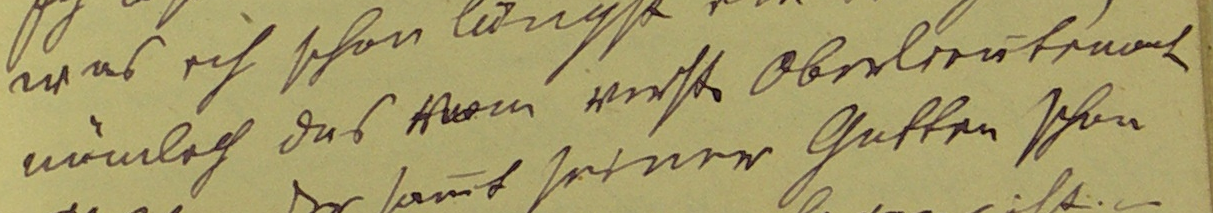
nämlich das vom ersten Oberleutenant
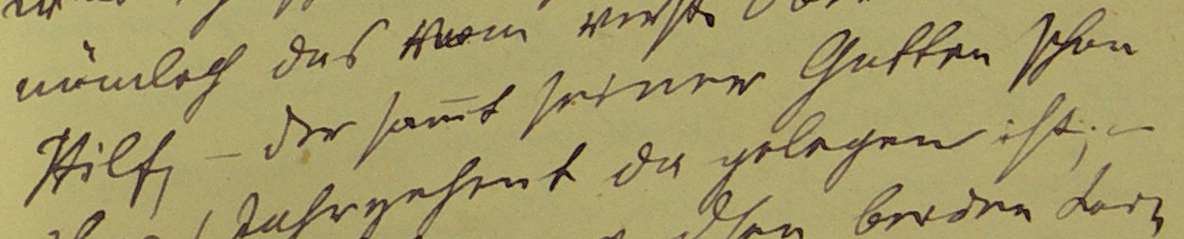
Hilf,--Der samt seiner Gattin schon
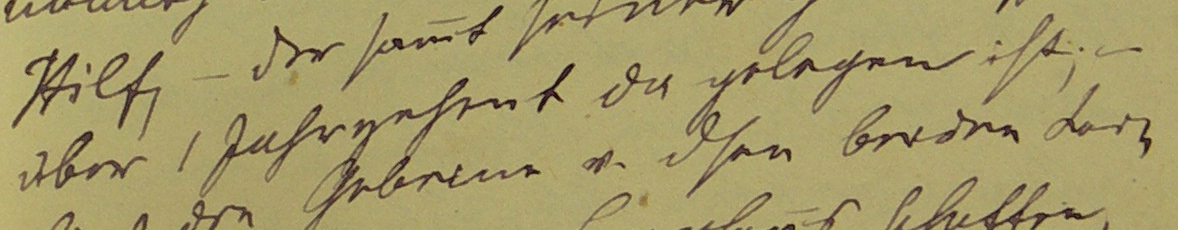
1 Jahrzehnt Da gelegen ist,-
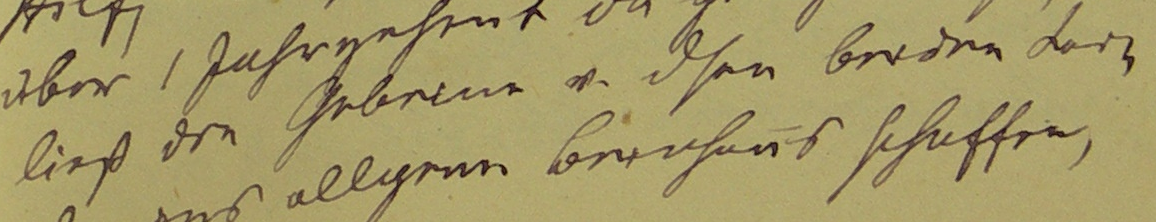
ließ die Gebeine von diesen bei¬
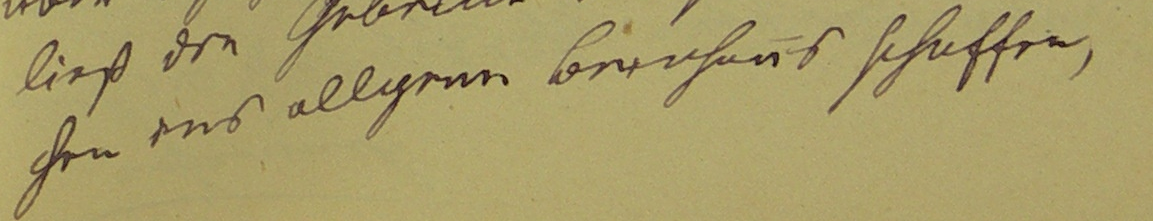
den ins allgemeine Beinhaus schaffen
